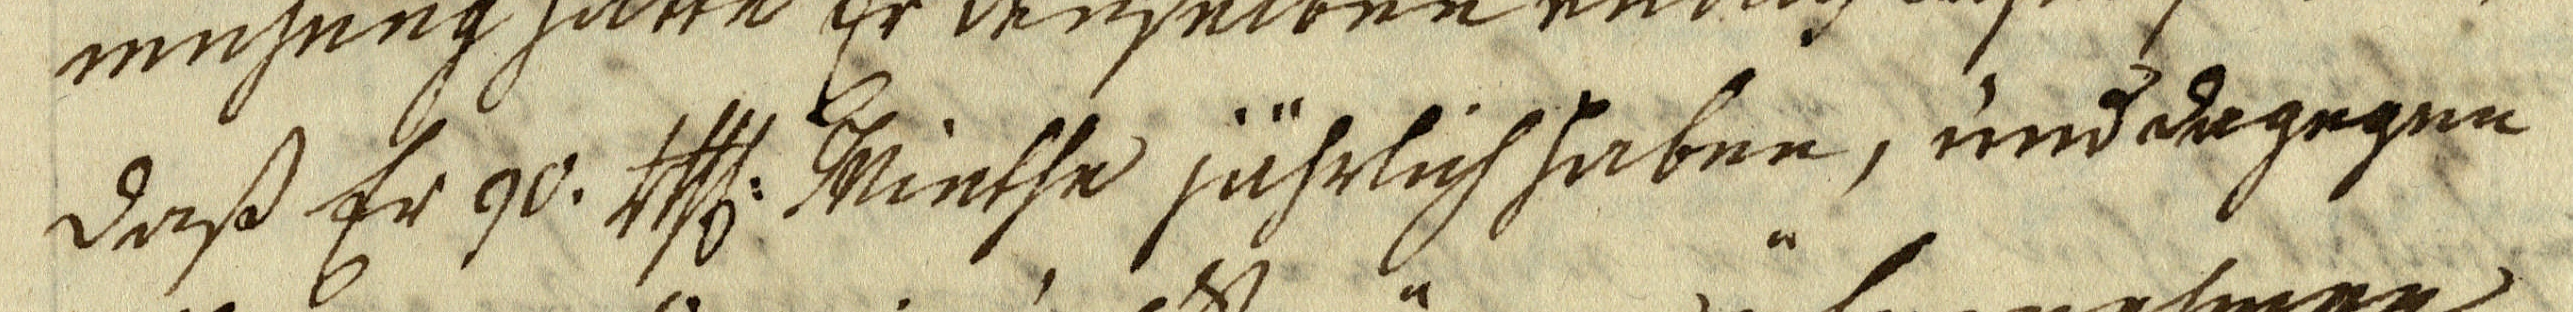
daß Er 90 rt. Miethe jährlich , und dagegen
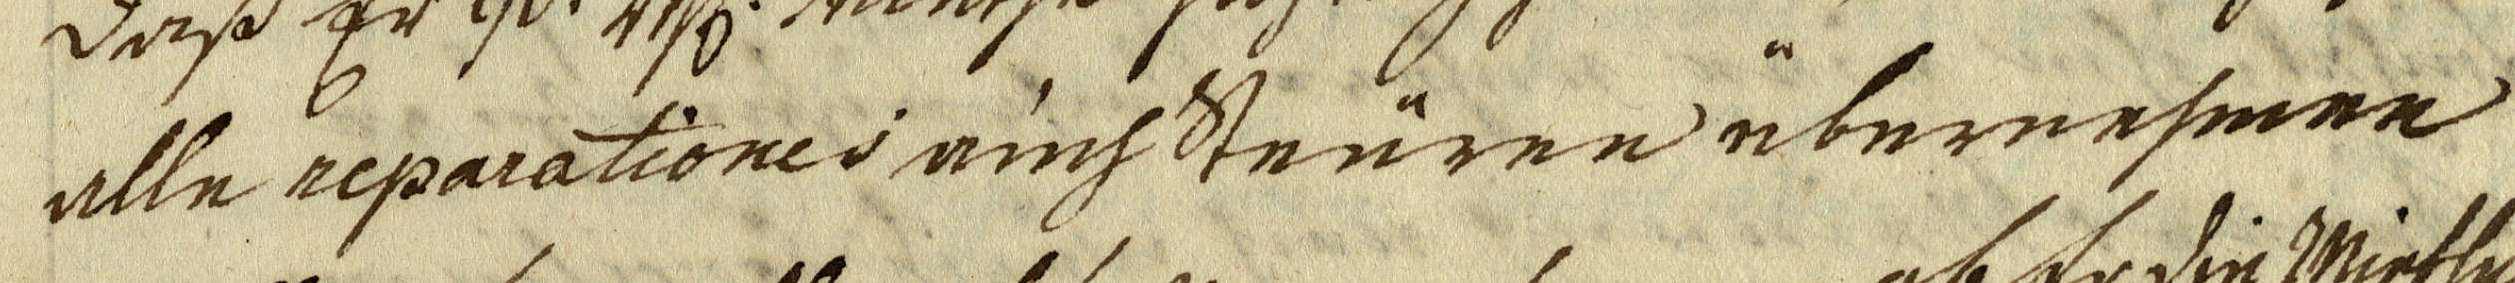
alle reparationes auch Steuern übernehmen
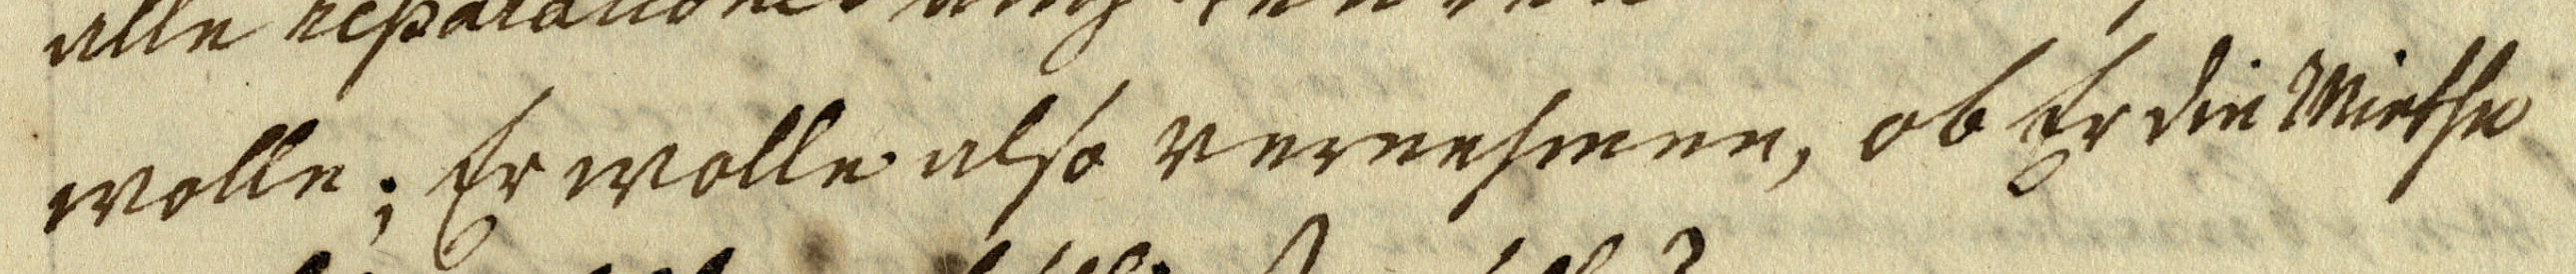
wolle; Er wolle also vernehmen, ob Er die Miethe
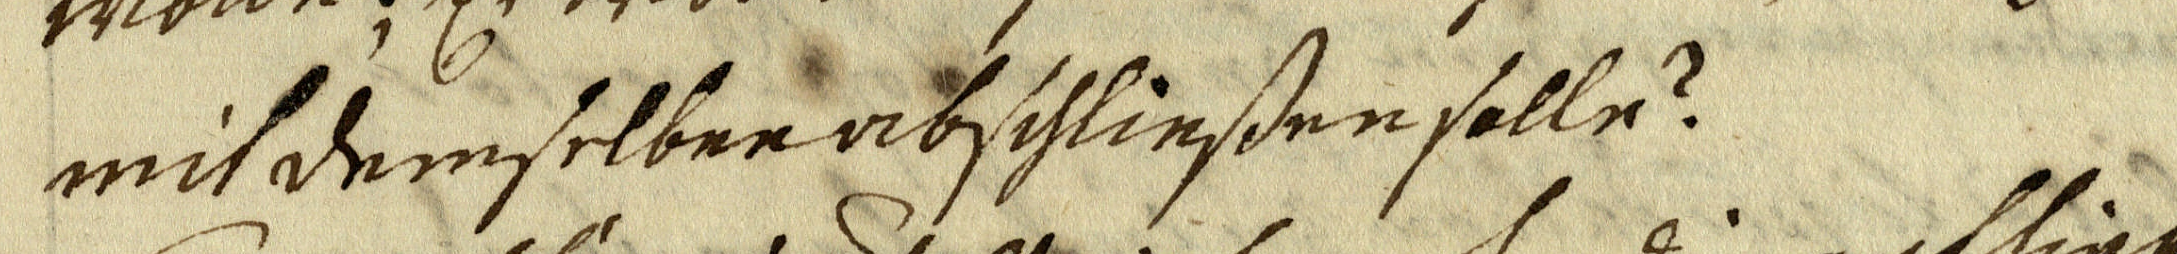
mit demselben abschließen solle?
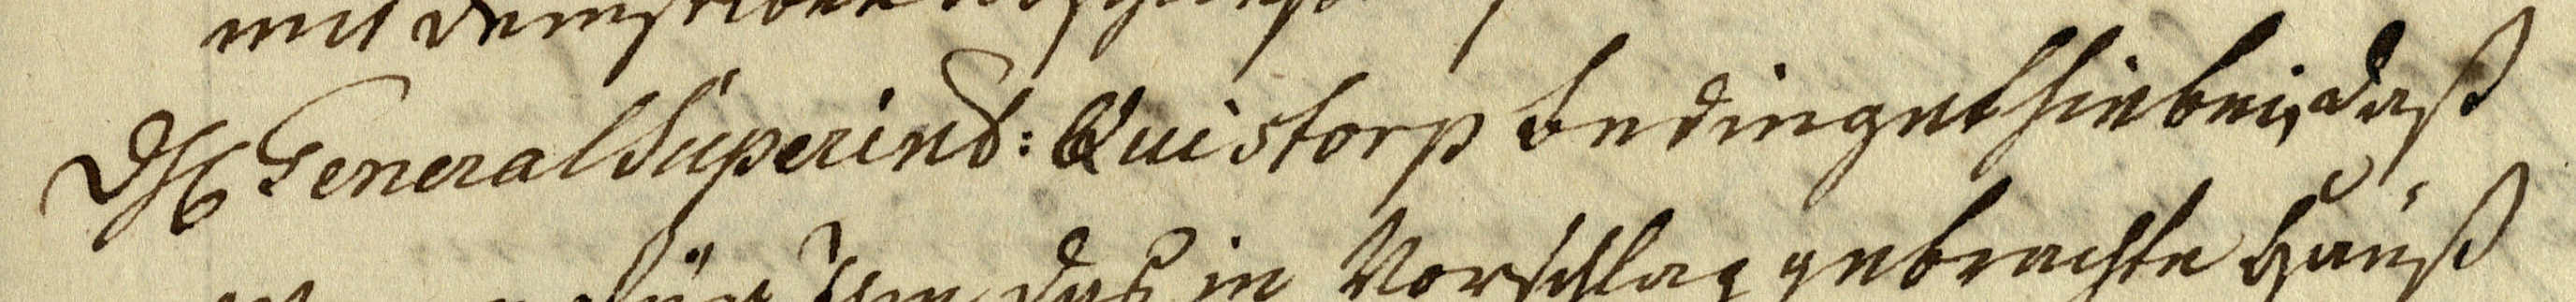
dh GeneralSuperint. Quistorp bedinget hiebei, daß
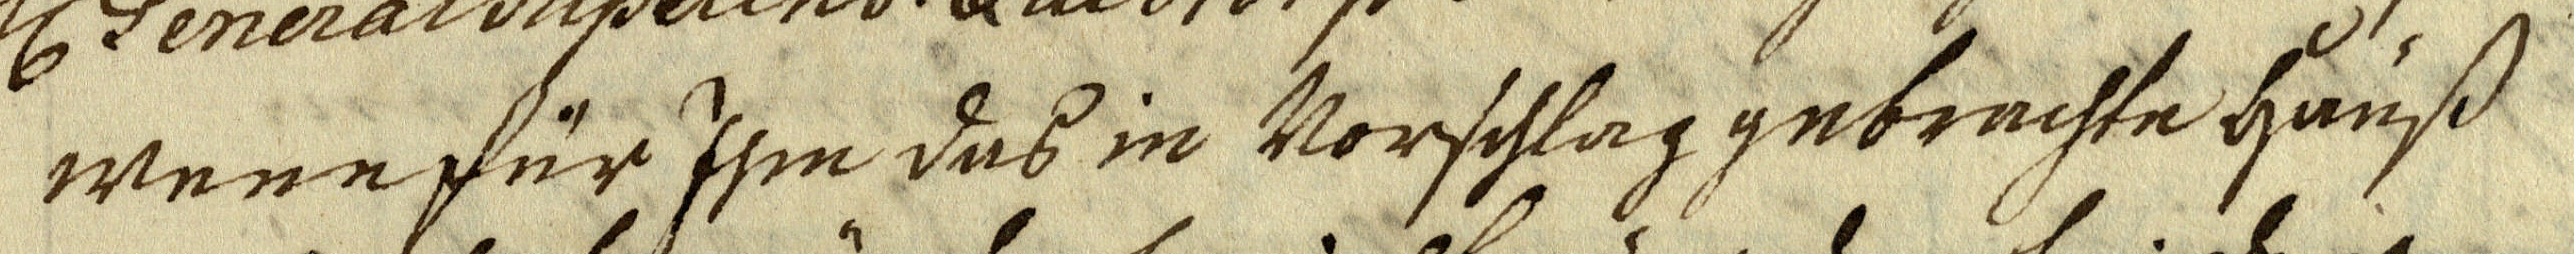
wenn für Ihm das in Vorschlag gebrachte Hauß
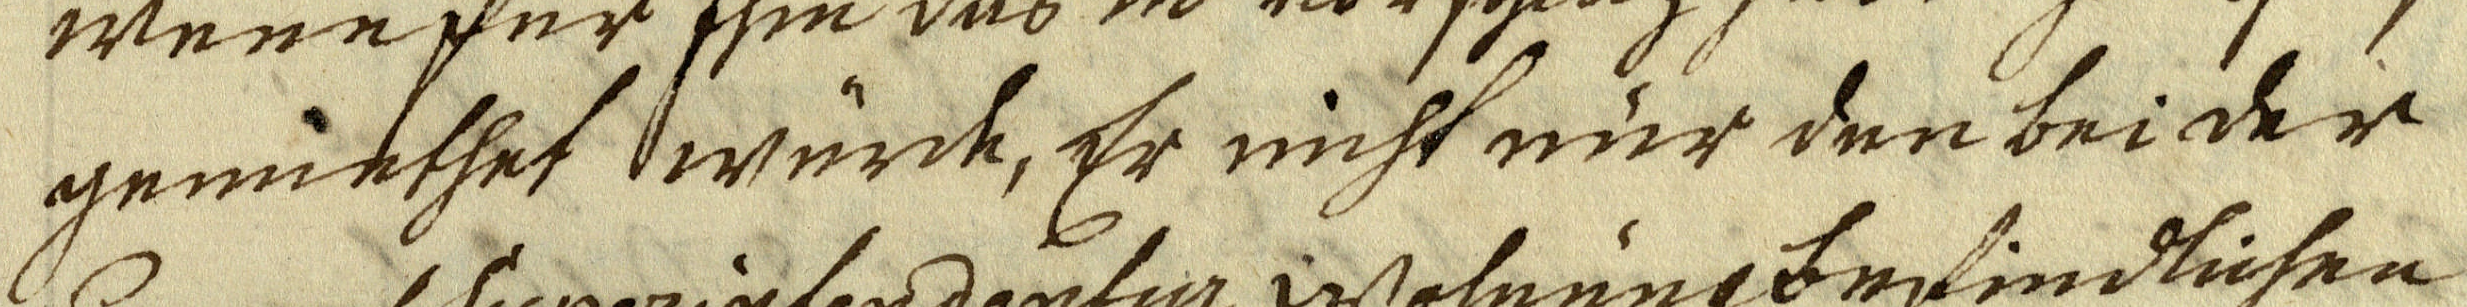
gemiethet würde, Er nicht nur den bei der
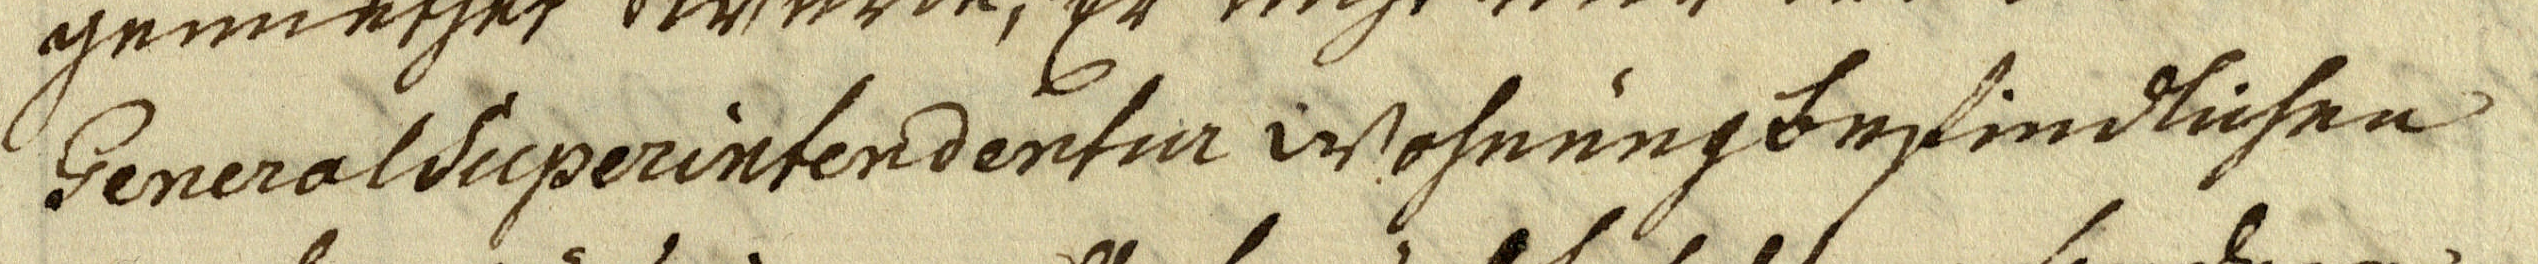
GeneralSuperintendentur Wohnung befindlichen
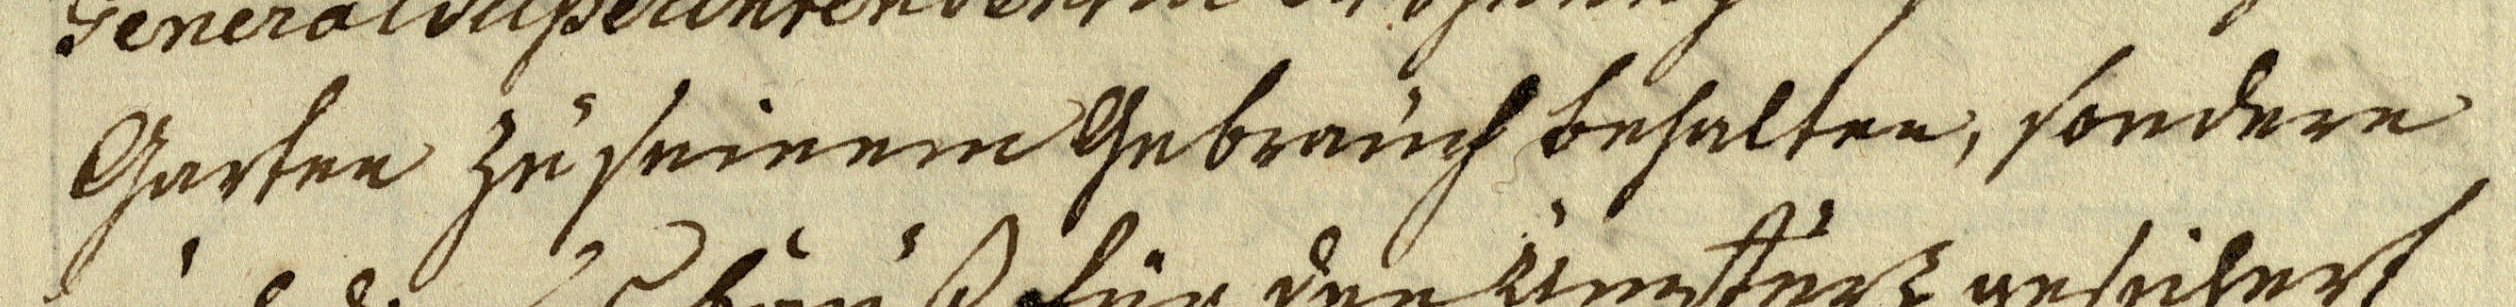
Garten zu seinem Gebrauch behalten, sondern
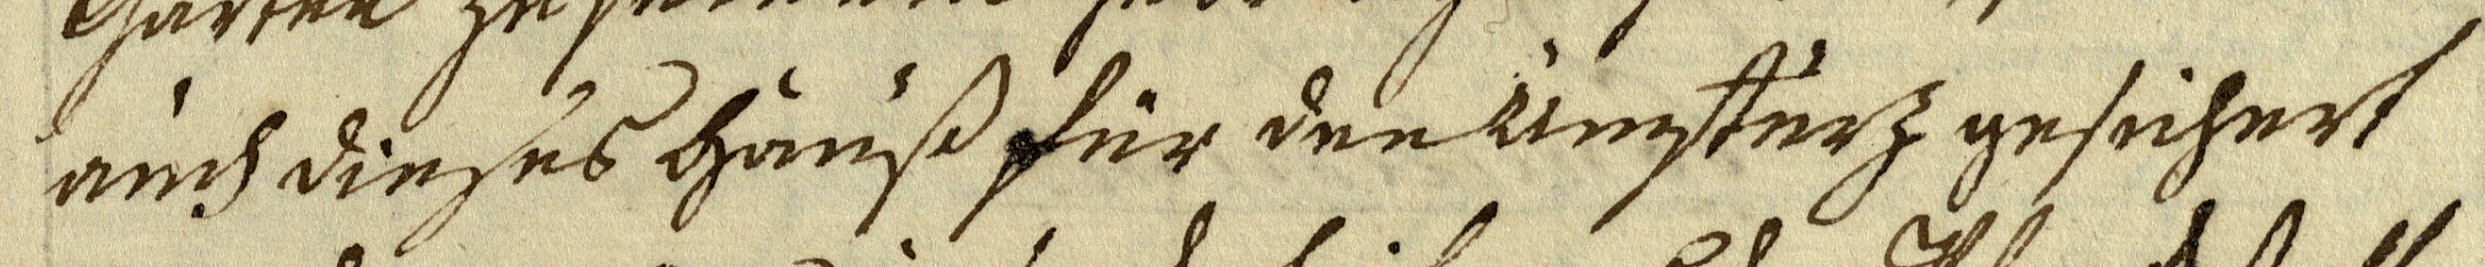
auch dieses Hauß für den Umsturz gesichert
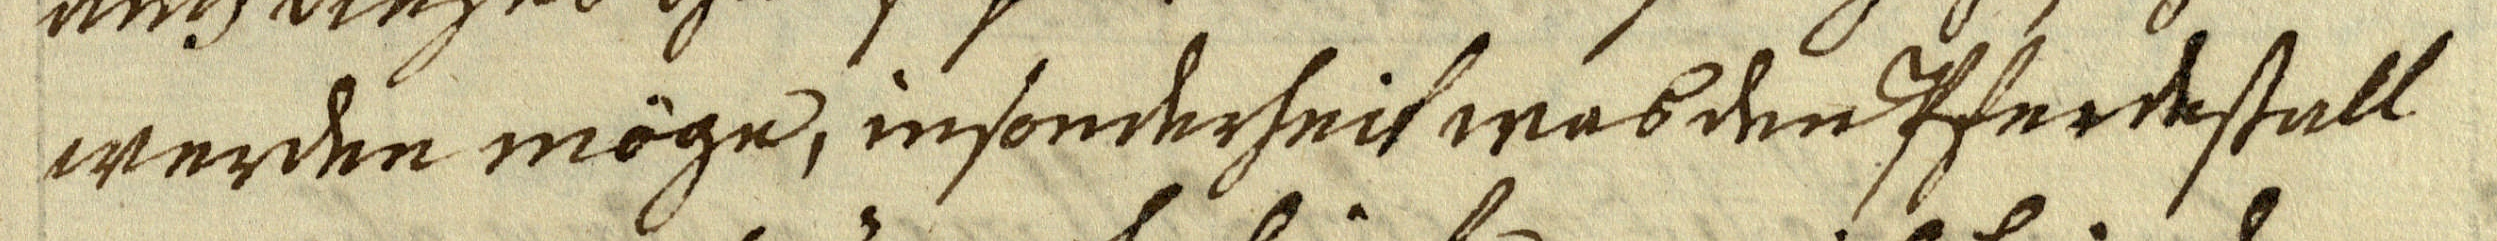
werden möge, insonderheit was den Pferdestall
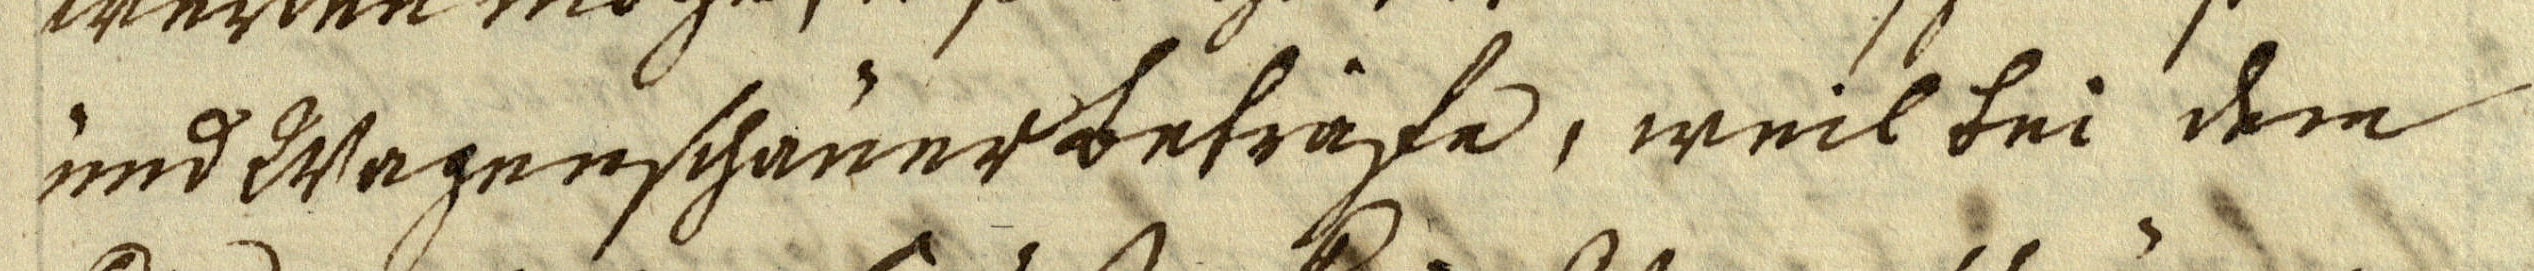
und Wagenschauer beträfe, weil bei dem
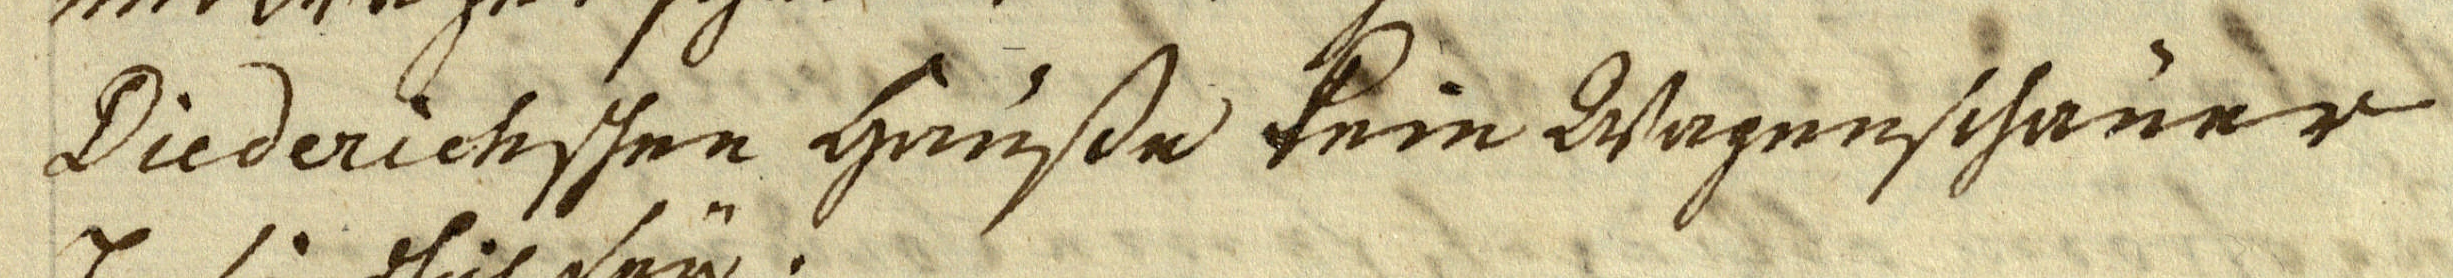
Diederichschen Hauße kein Wagenschauer
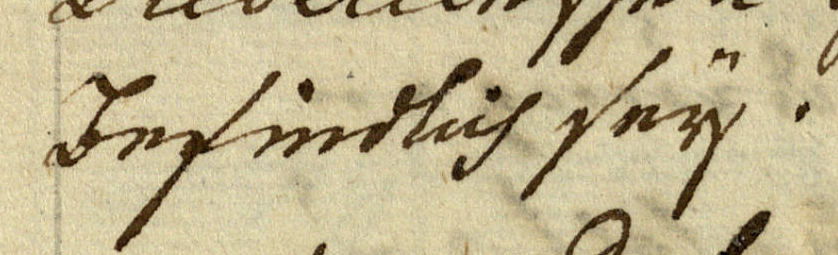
befindlich sey.
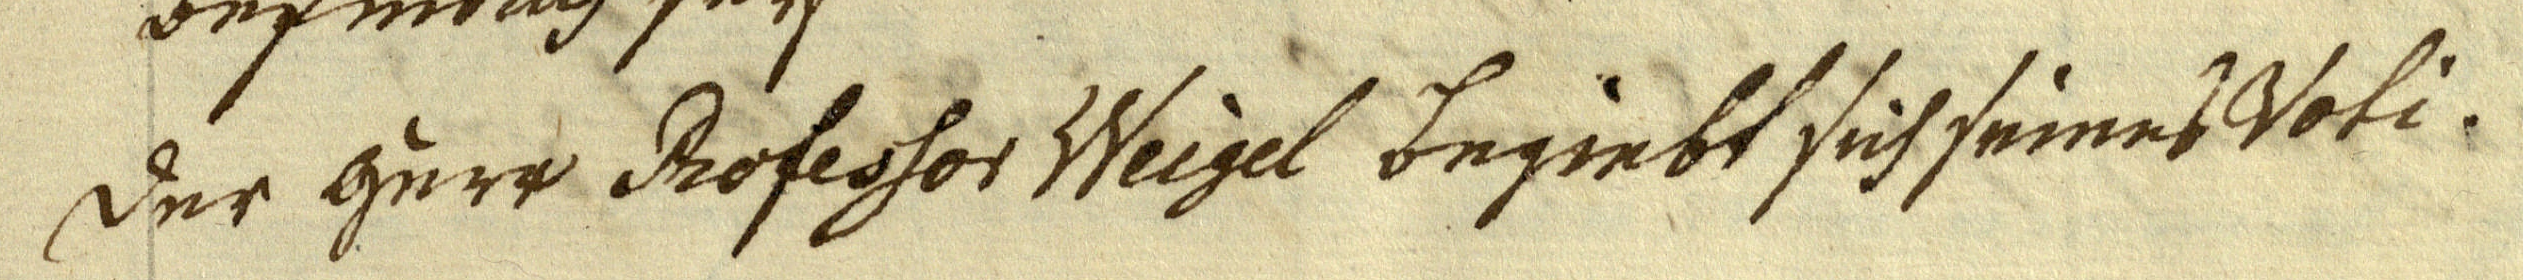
Der Herr Professor Weigel begiebt sich seines Voti.
